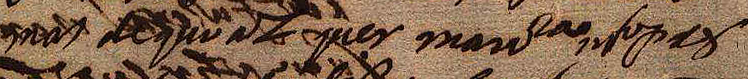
mas de quoalquer manra mto pres
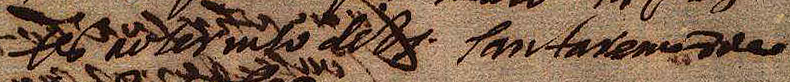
tes ao seruiso de Vs. Santarem 8 de
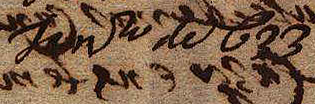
Janro de 633
